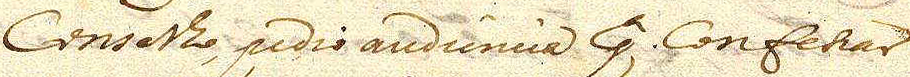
Conselho, pedio audiencia pa. Confessar
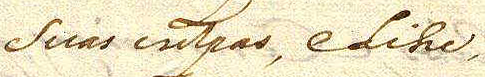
suas culpas, e disse,
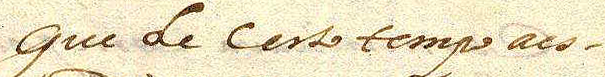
que de certo tempo a es
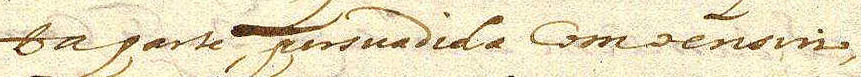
ta parte, persuadida Com o ensino,
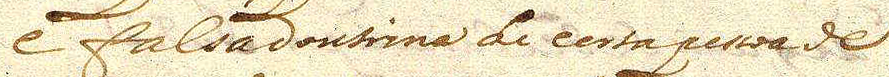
e falsa doutrina de certa pessoa de
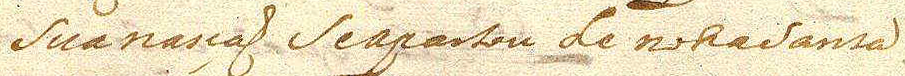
sua nasçaõ Se apartou de nossa Santa
